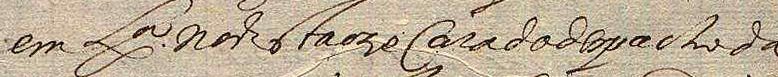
em Lxa. nos Estaoz e Caza do despacho da
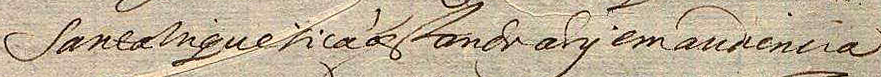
Santa Inquesicaõ estando ahy em audiencia
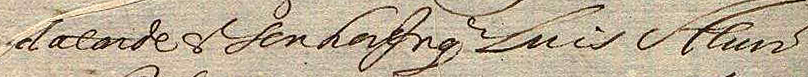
da tarde o senhor Jnqor luis Alurz̄
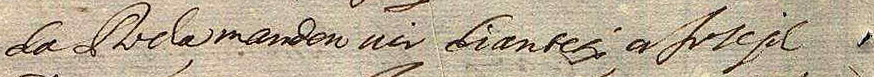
da Rocha, mandou uir diante sy a Joseph
